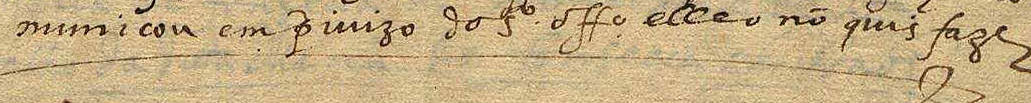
municou em p̄iuizo do sto. offo. elle o nō quis fazer
